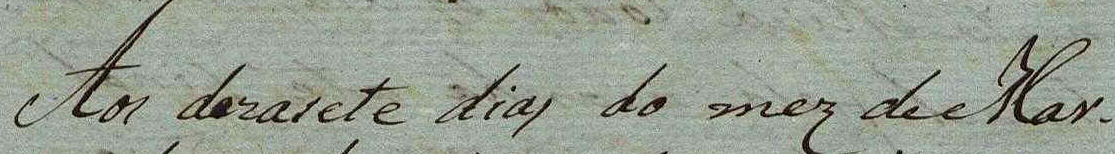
Aos dezasete dias do mez de Mar
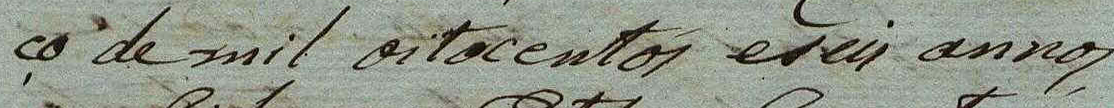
ço de mil oitocentos e seis annos,
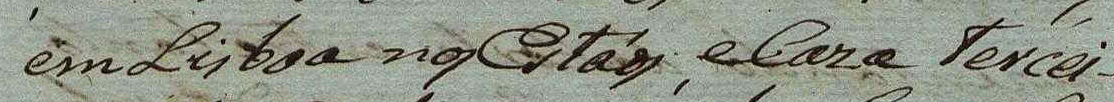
em Lisboa nos Estáos, e Caza tercei
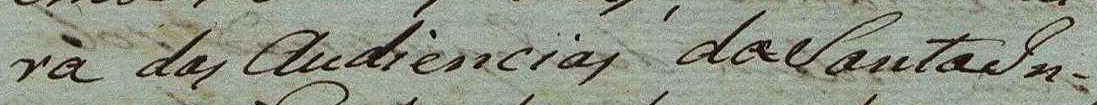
ra das Audiencias da Santa In
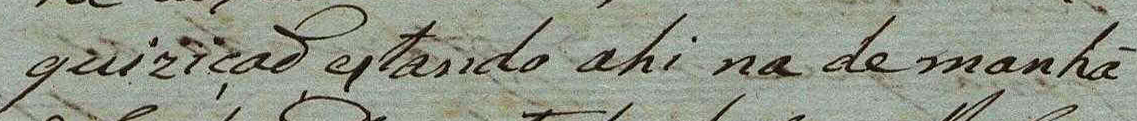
quiziçaõ, estando ahi na de manhã
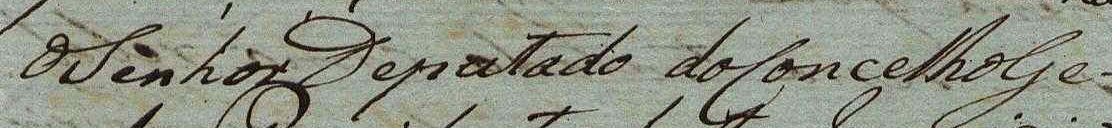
o Senhor Deputado do Concelho Ge
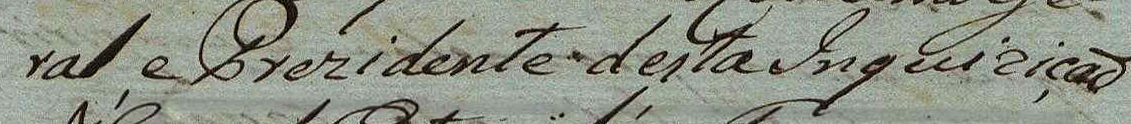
ral, e Prezidente desta Inquiziçaõ
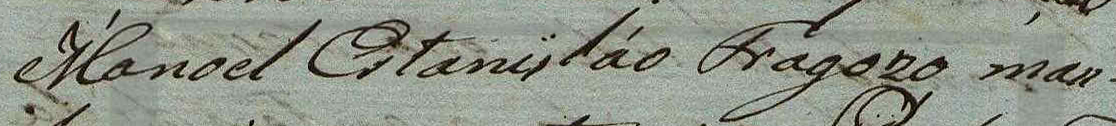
Manoel Estanisláo Fragozo, man
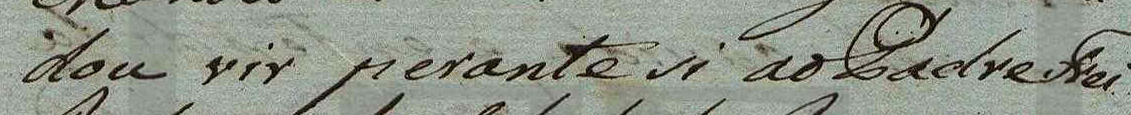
dou vir perante si ao Padre Frei
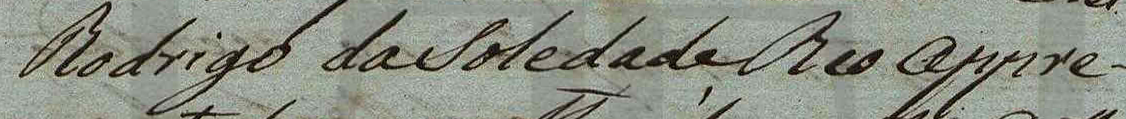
Rodrigo da Soledade, Reo appre
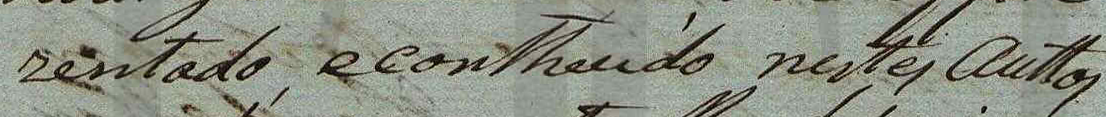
zentado, e contheudo nestes Auttos
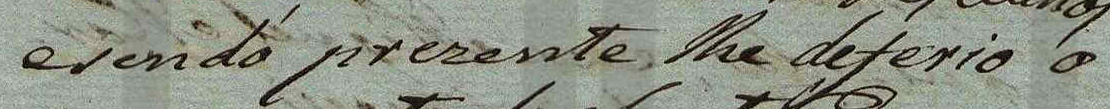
e sendo prezente lhe deferio o
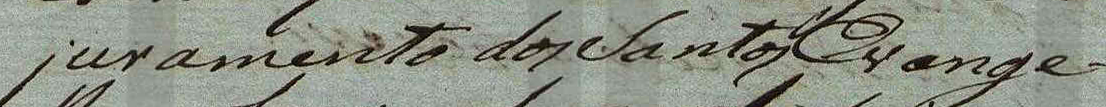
juramento dos Santos Evange
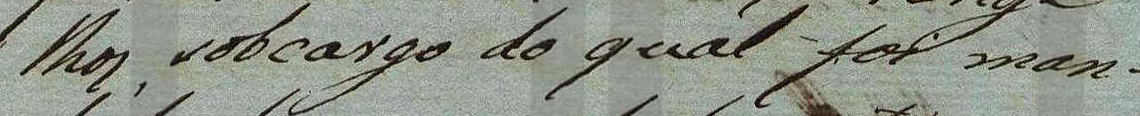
lhos sob cargo do qual foi man
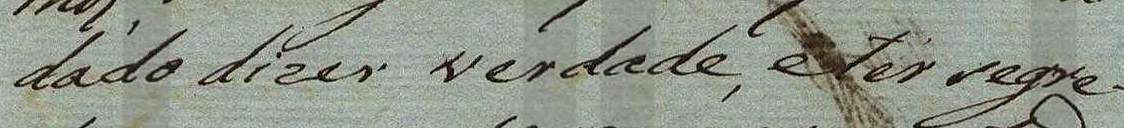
dado dizer verdade, e ter segre
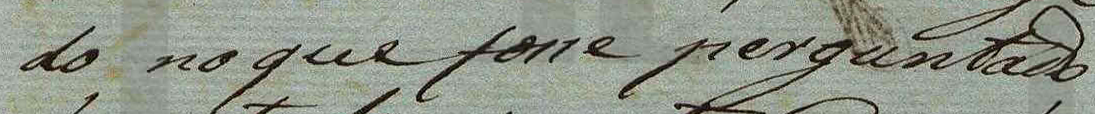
do no que fosse perguntado
